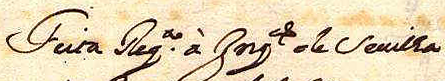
Feita Req.to à Jnqção de Seuilha
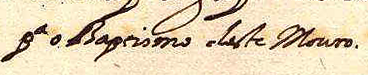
pa o Baptismo deste Mouro.
